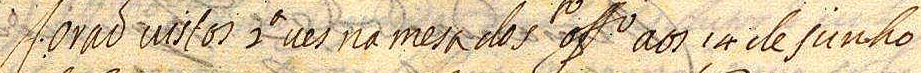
foraõ uistos 2a ues na mesa do sto offo aos 14 de junho
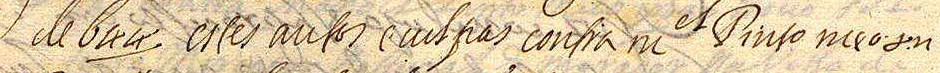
de 644 estes autos e culpas contra mel Pinto meo x.n
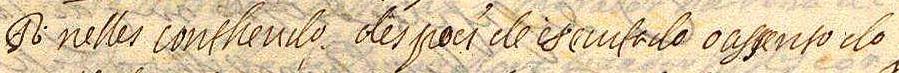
R. nelles contheudo, despoes̄ de ixecutado o assento do
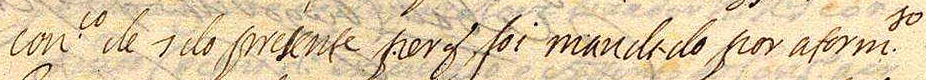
con.co de 7 do presente per q̄ foi mandado por a torm.to
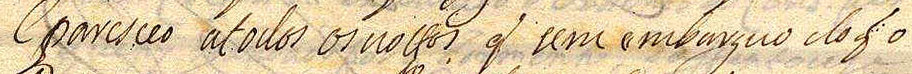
E paresceo a todos os uottos q̄ sem embarguo do q̄ o
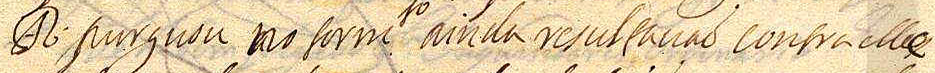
R. purguou no torm.to ainda resultauaõ contra elle
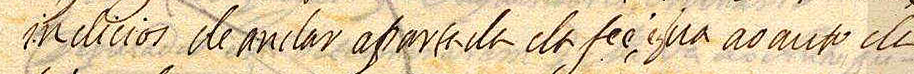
indicios de andar apartada da feé, e q̄ ua ao auto da
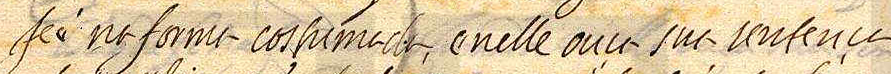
feé na forma costumada, e nelle ouça sua sentença
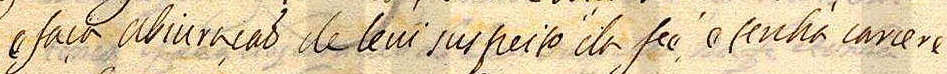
e faça abiuraçaõ de leui suspeito da feé, e tenha carcere
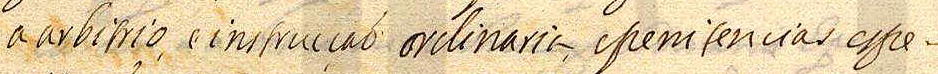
a arbitrio, e instrucçaõ ordinaria, e penitencias espe
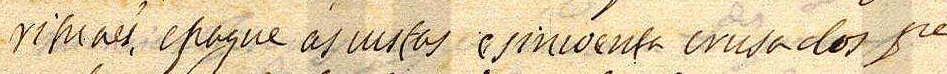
rituaes̄, e pague as custas e sincoenta crusados pa
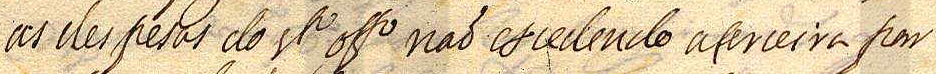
as despesas do sto offo naõ excedendo a terceira par
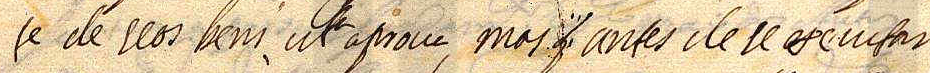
te de seos bens, uta a proua, mas q̄ antes de se executar
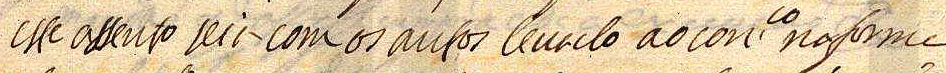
este assento seia com os autos leuado ao con.co na forma
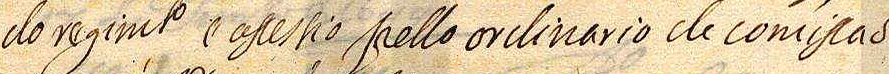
do regimto e assestio pello ordinario de comissaõ
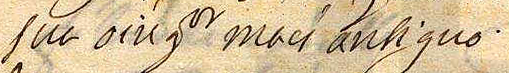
sua o inqor maes̄ antiguo.
